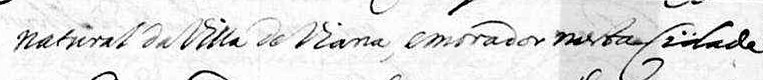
natural da Villa de Viana, e morador nesta Cidade
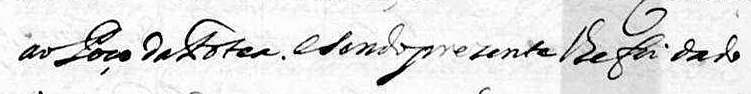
ao Poço da Fotea. e sendo prezente lhe foi dado
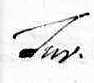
Iur.
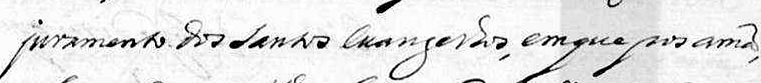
juramento dos santos euangelhos, em que pos a mão,
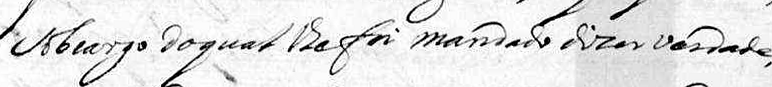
Sob cargo do qual lhe foi mandado dizer verdade
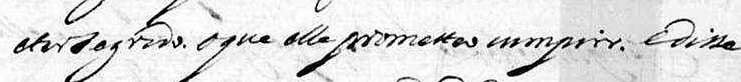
e ter segredo. o que elle prometteo cumprir. e disse
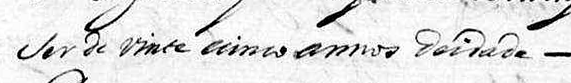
Ser de vinte e cinco annos de idade -
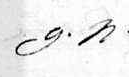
g. n.
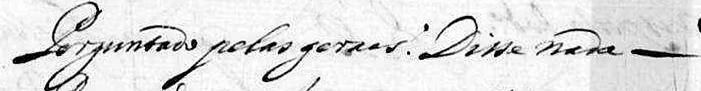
Perguntado pelas geraes: Disse nada -
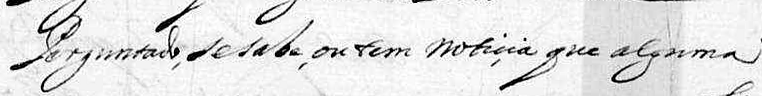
Perguntado, se sabe, ou tem noticia que alguma
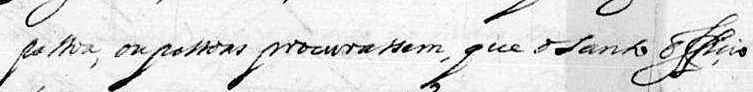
pessoa, ou pessoas procurassem, que o santo officio
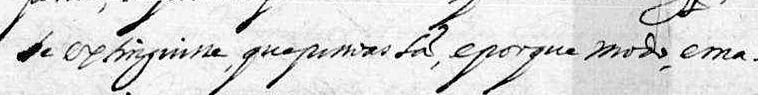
se extinguisse, que pessoas saõ, e porque modo, e ma
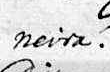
neira?
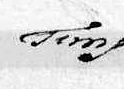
Temp.
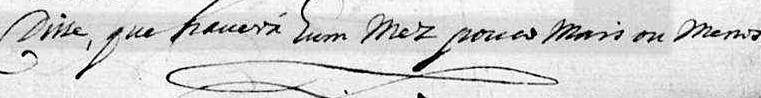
Disse, que hauerá hum mez pouco mais ou menos
